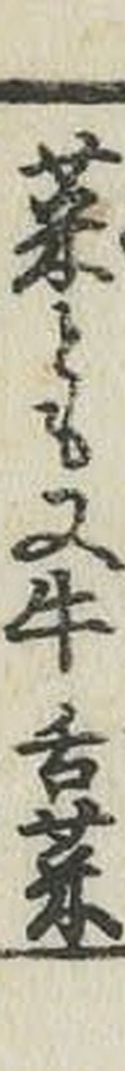菜とも又牛舌菜
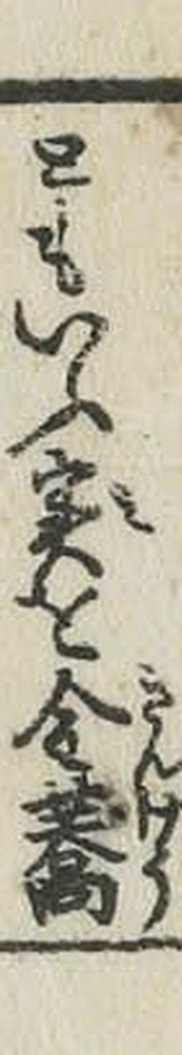ともいふ実を金蕎
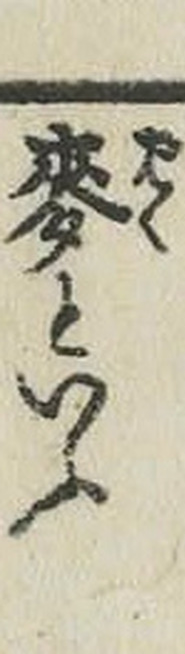麦といふ

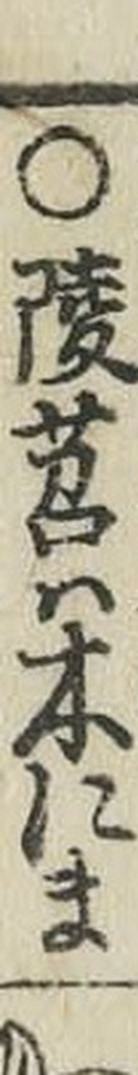○陵苕は木にま
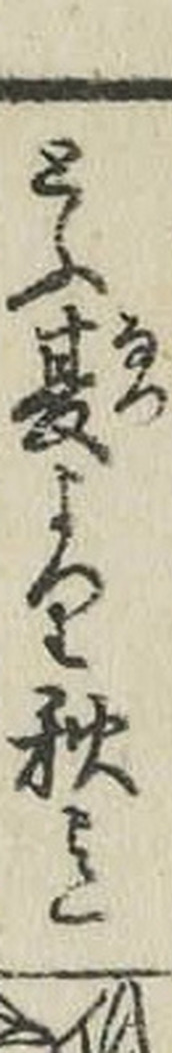とふ夏より秋まて
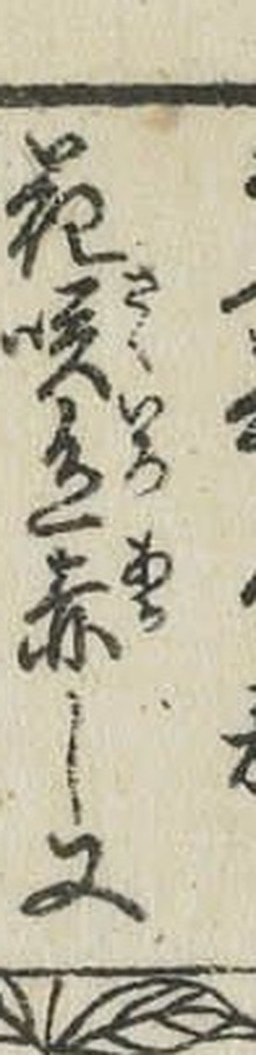花咲色赤し又
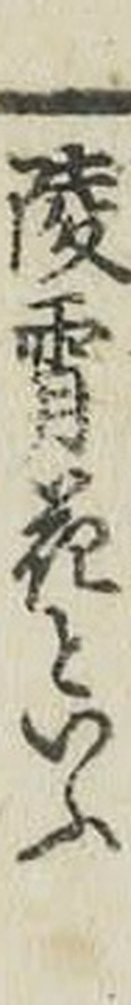陵霄花といふ
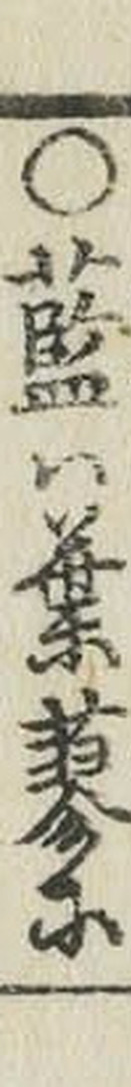○藍は葉蓼に
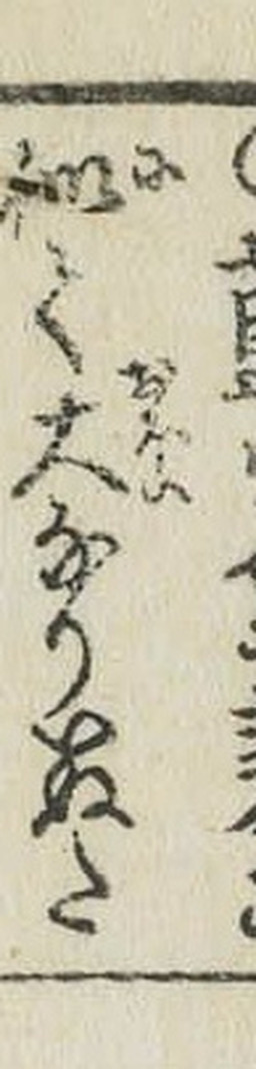似て大なりいぬた
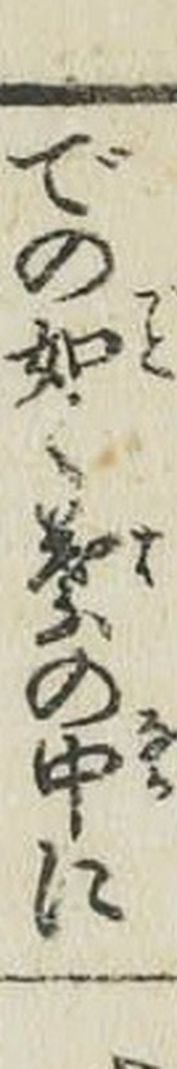での如く葉の中に
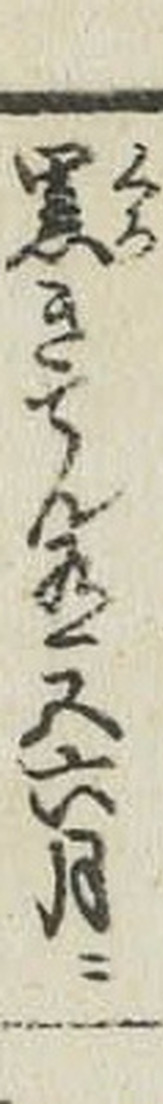黒きてん有五六月に
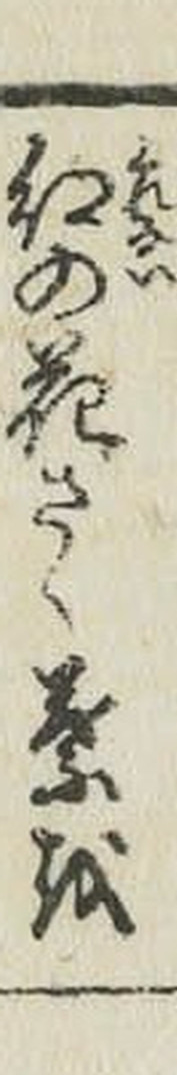紅の花さく葉を
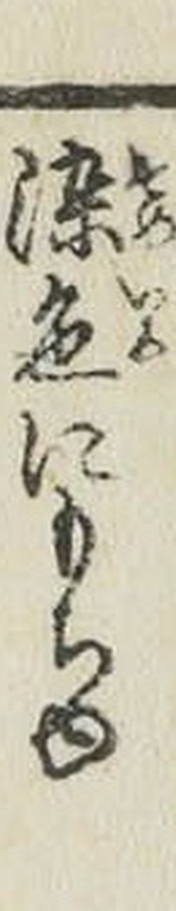染色にもちゆ
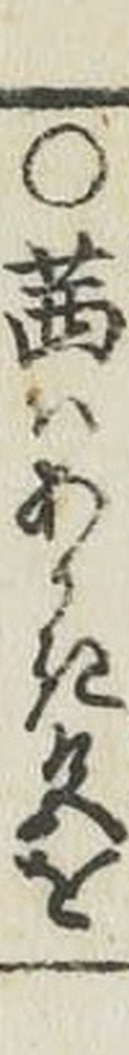○茜はあかき色を
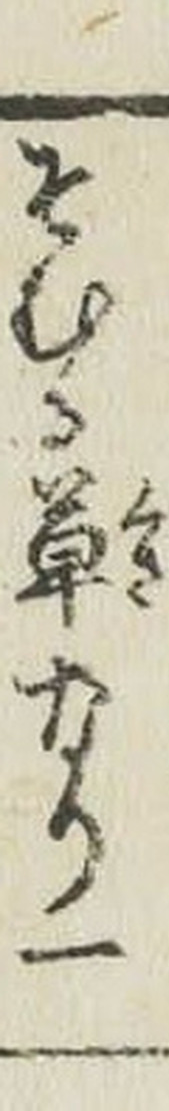そむる草なり一
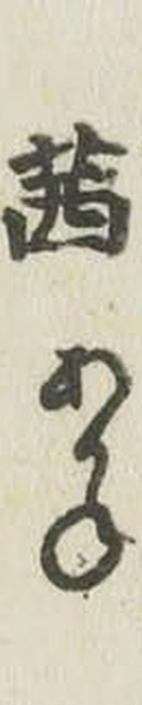茜あかね
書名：増補頭書訓蒙図彙大成 10巻 9:巻之20
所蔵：東京学芸大学教育コンテンツアーカイブ
